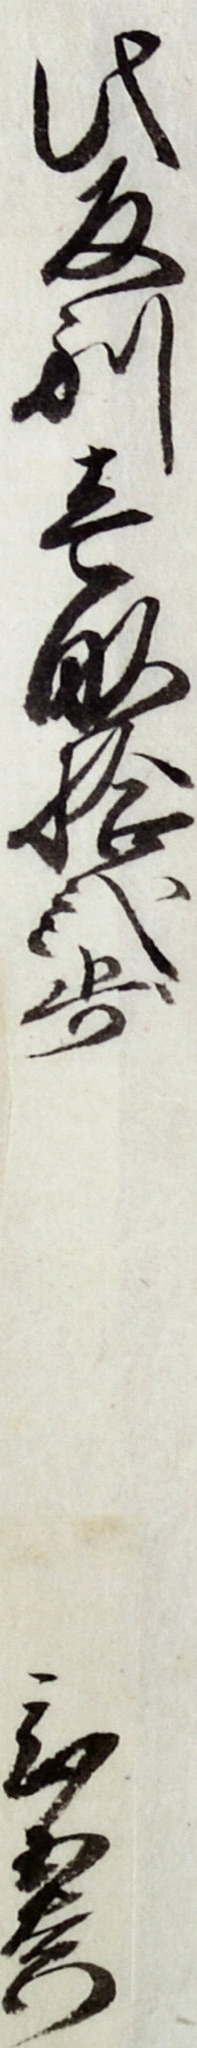此反別壱畝拾弐歩甚五右衛門

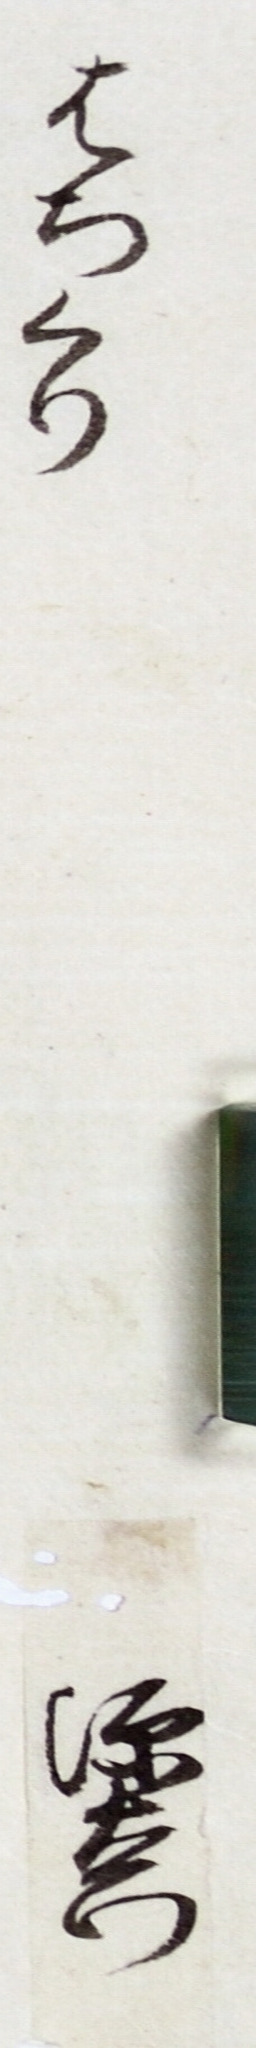はちくり源右衛門
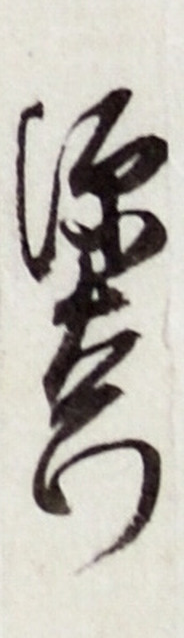小右衛門
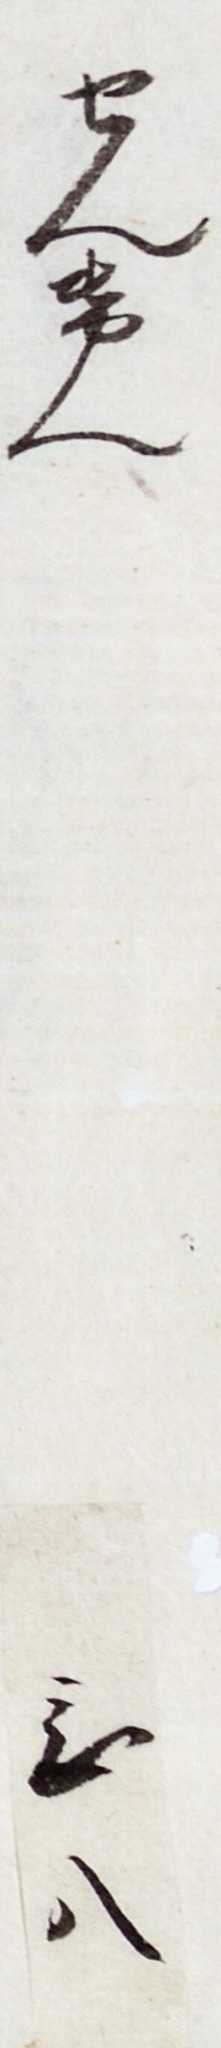せんけん甚八
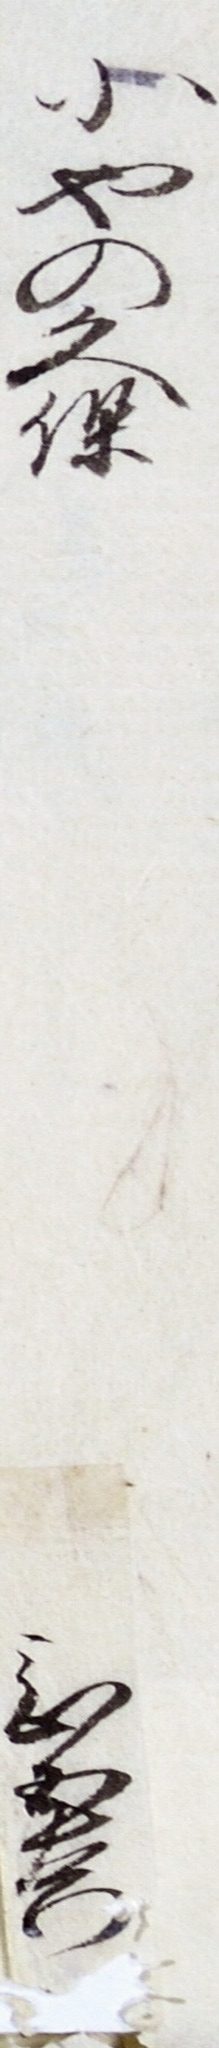小やの久保甚五右衛門
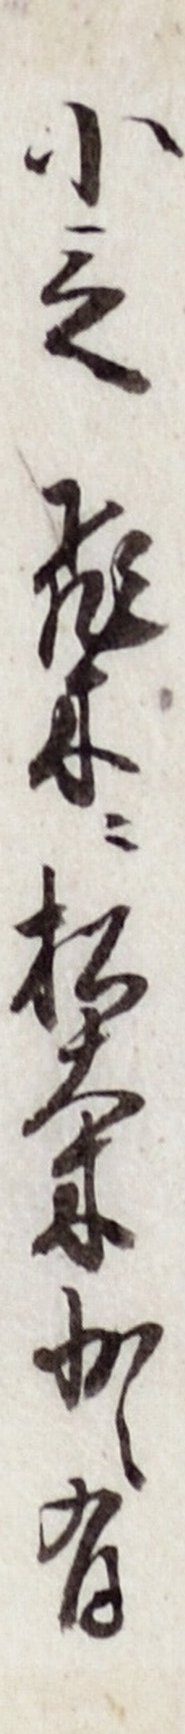小立飛木ニ松大木少々有
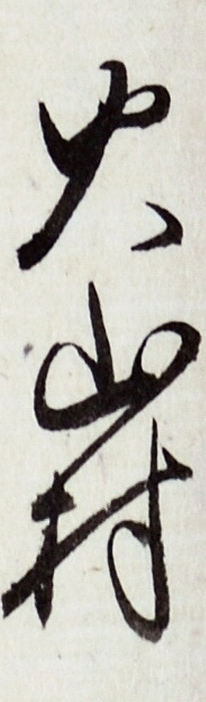火山村
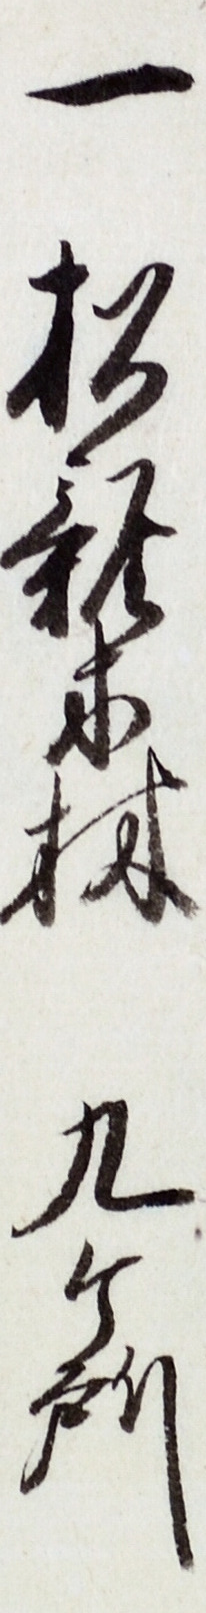一松雑木林九ケ所
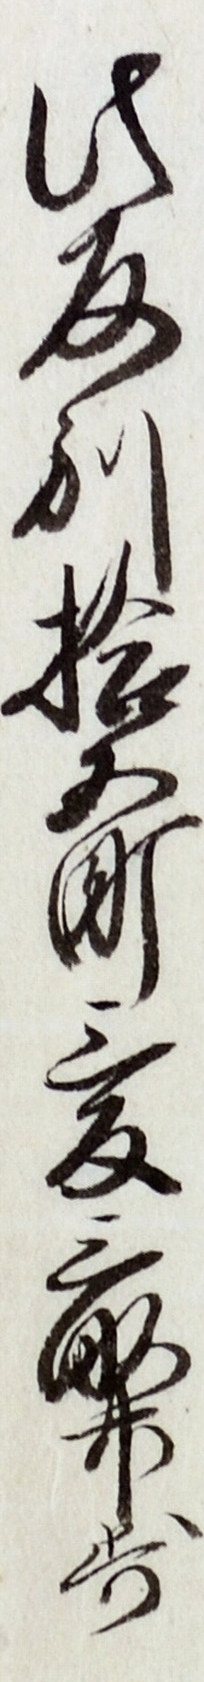此反別拾五町三反三畝廿歩
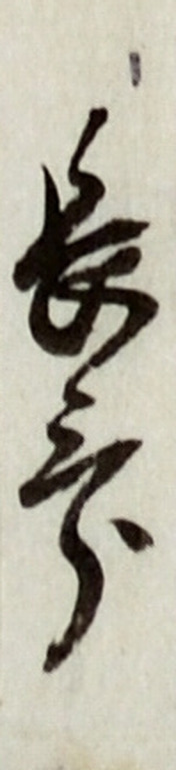長三郎
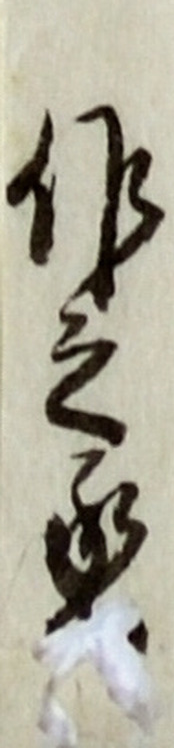作之烝
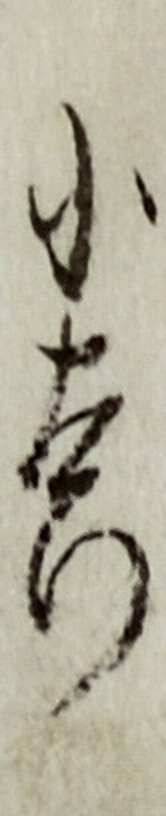小右衛門

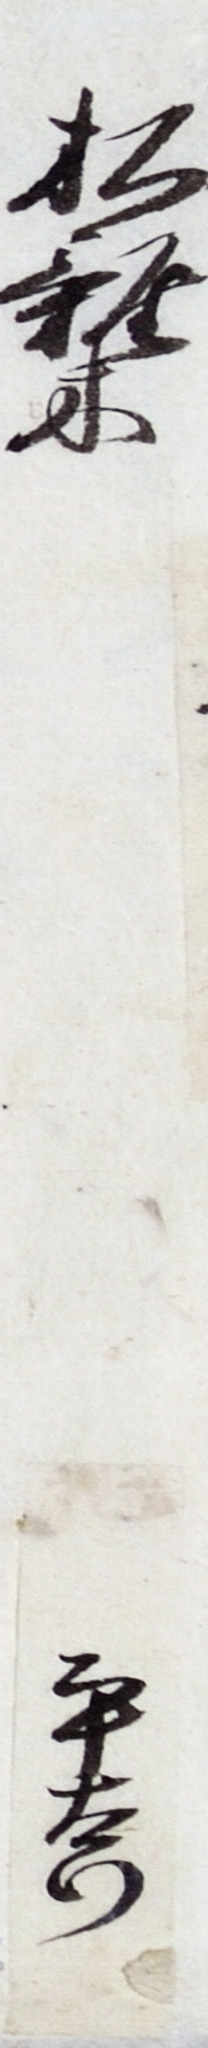松雑木平右衛門
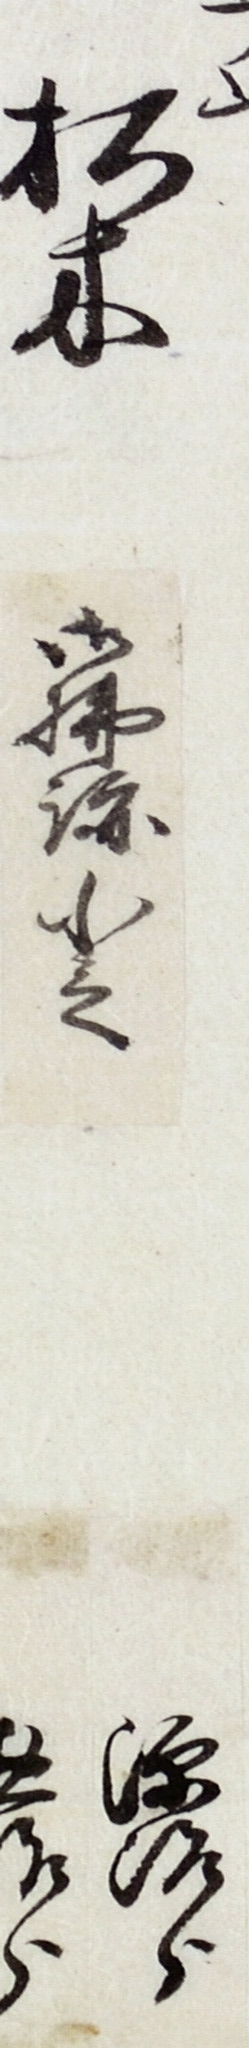松木御払跡小立惣治郎

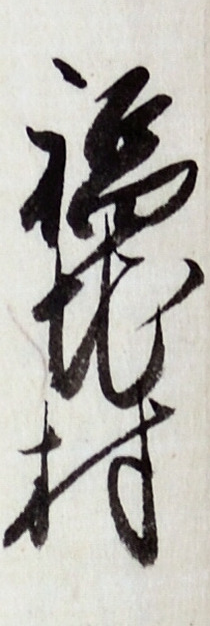福地村
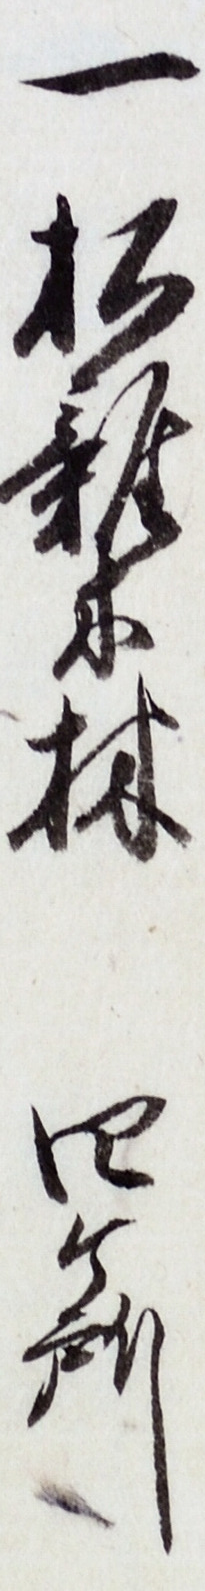一松雑木林四ケ所
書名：御領分中御林御藪附帳
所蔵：伊那市立高遠町図書館・合同会社AMANE
